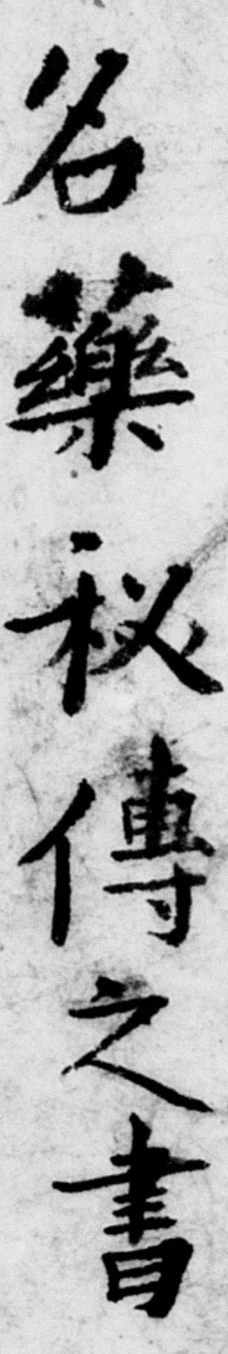名薬秘傳之書

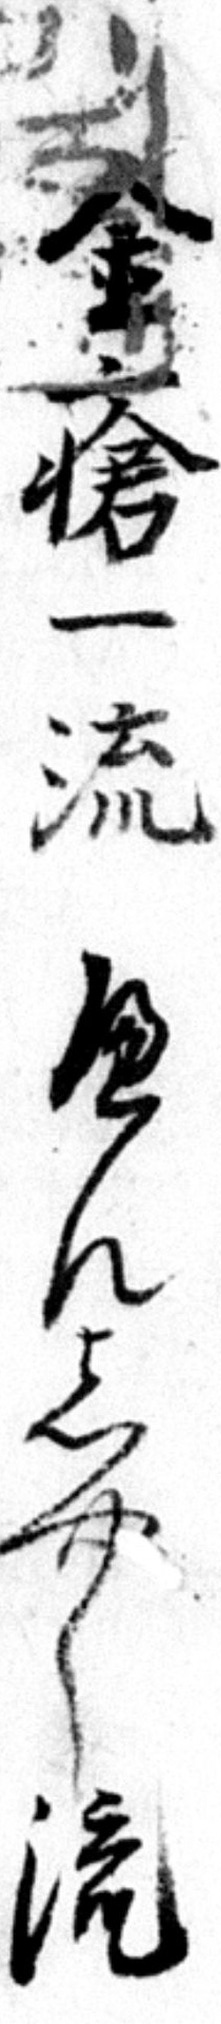金瘡一流へんしやく流
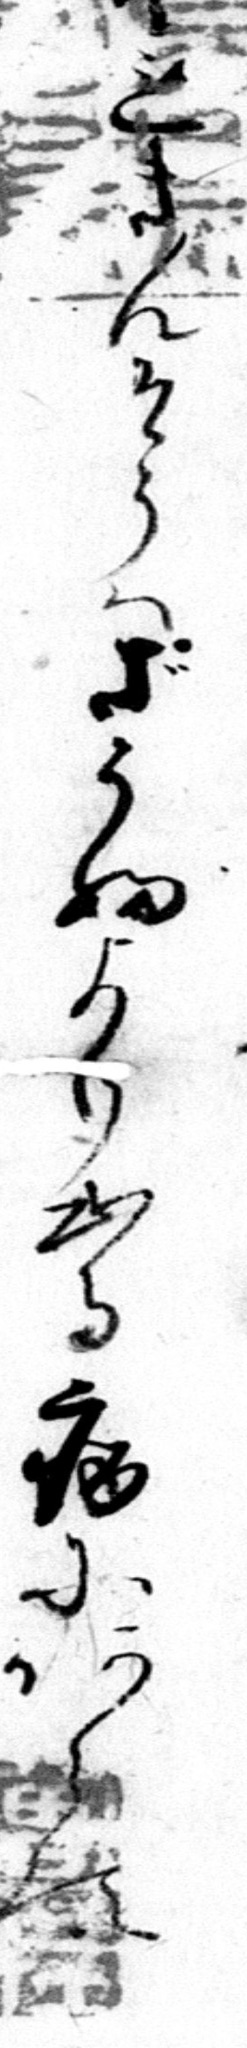それきんそうはざうふより出る病にあらす
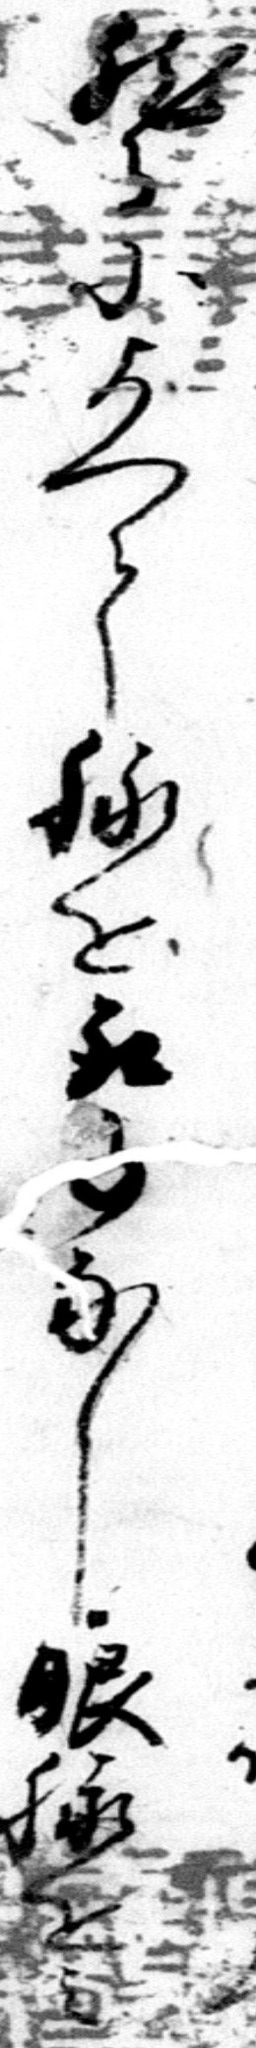然るによつて脈を取事なし、眼脈をみ
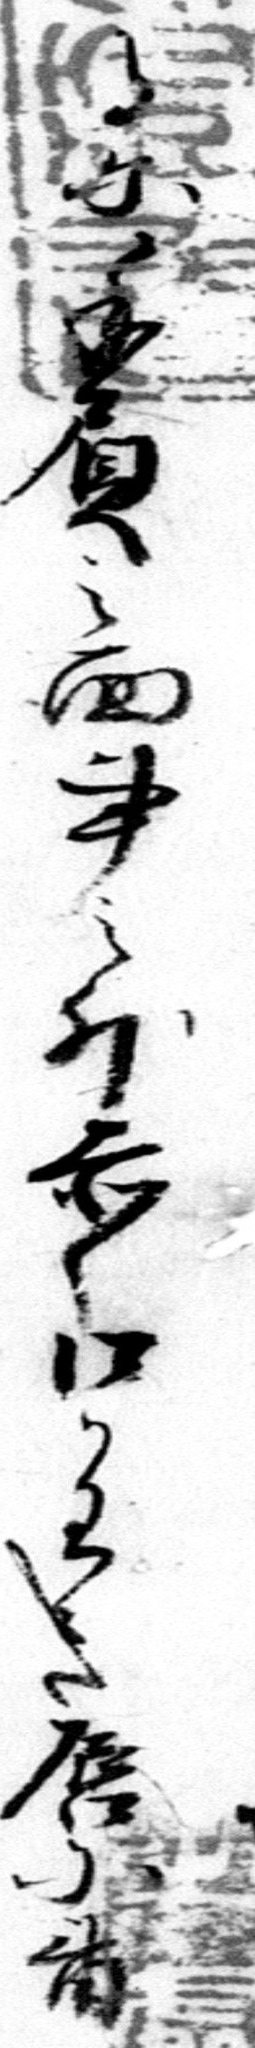るに手屓の面事の外赤く口かわき唇に青
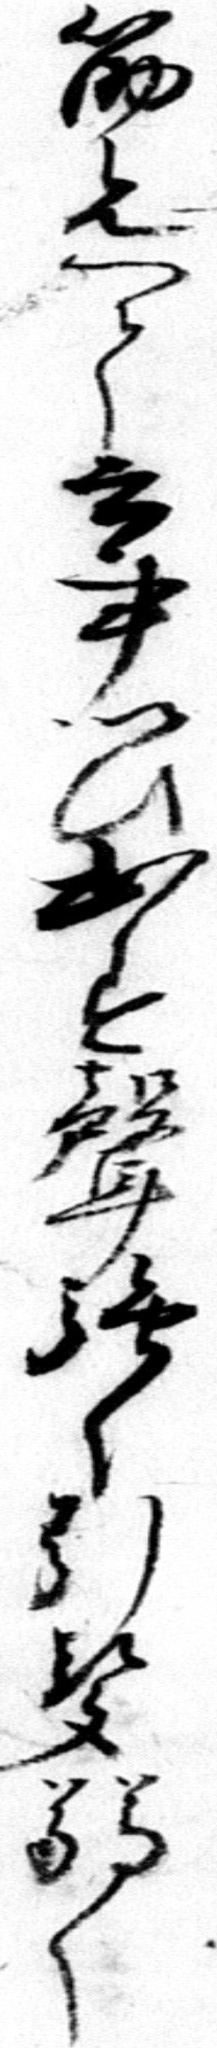筋見へて云事いひ出す声強く引声弱く
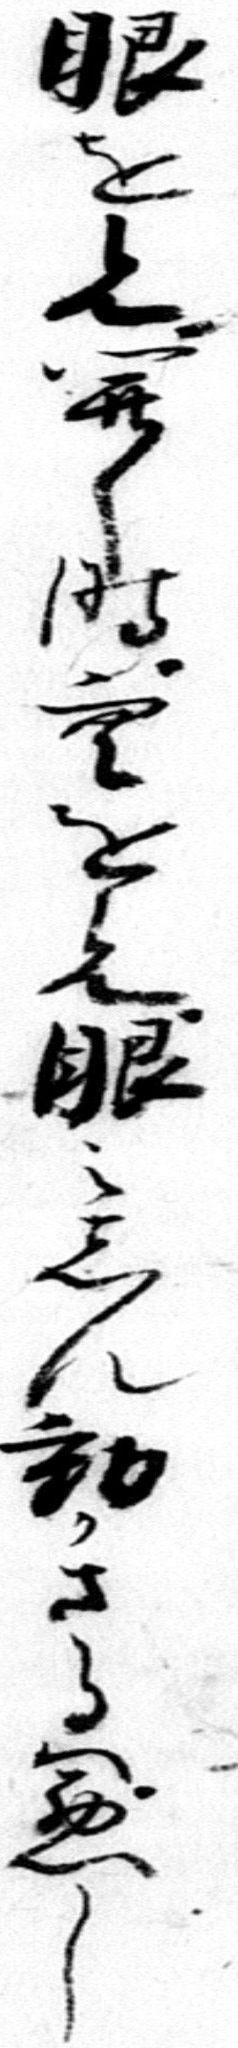眼を見開く時、空を見、眼のしん動かさるは、悪し
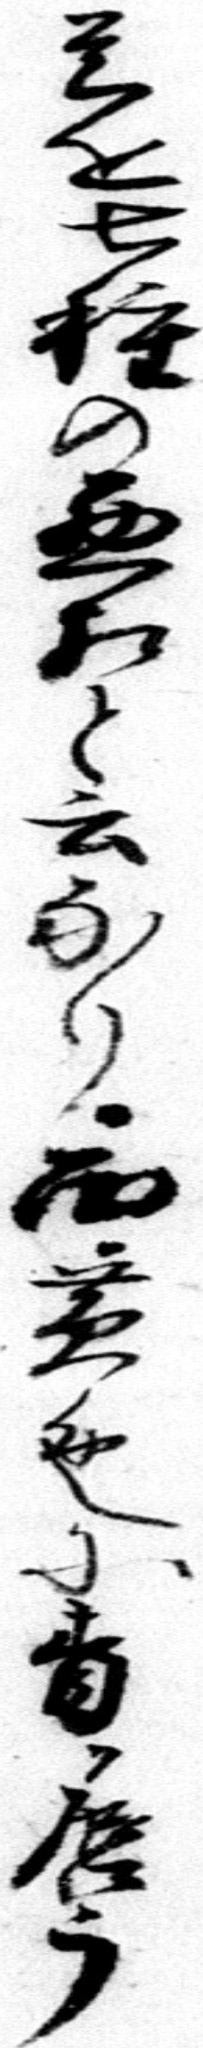是を七種の悪相と云なり。面黄色に青く唇う
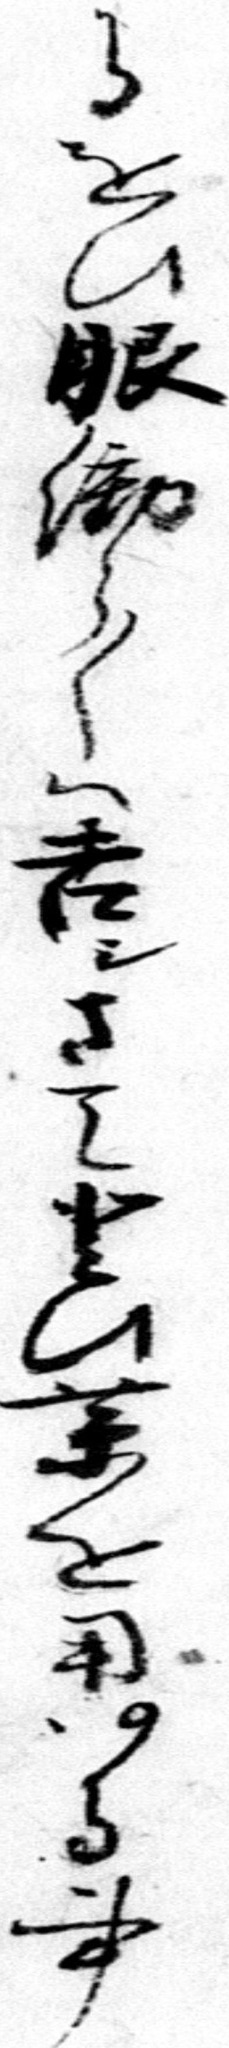るをい眼働らくは吉しさてとひ薬を用ゆる事
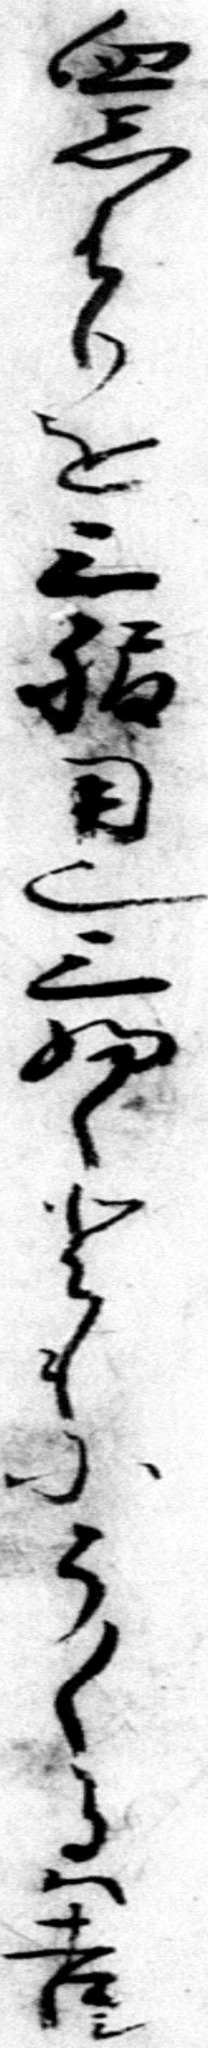血しはりを三服用也三ふくともにうくるは吉し
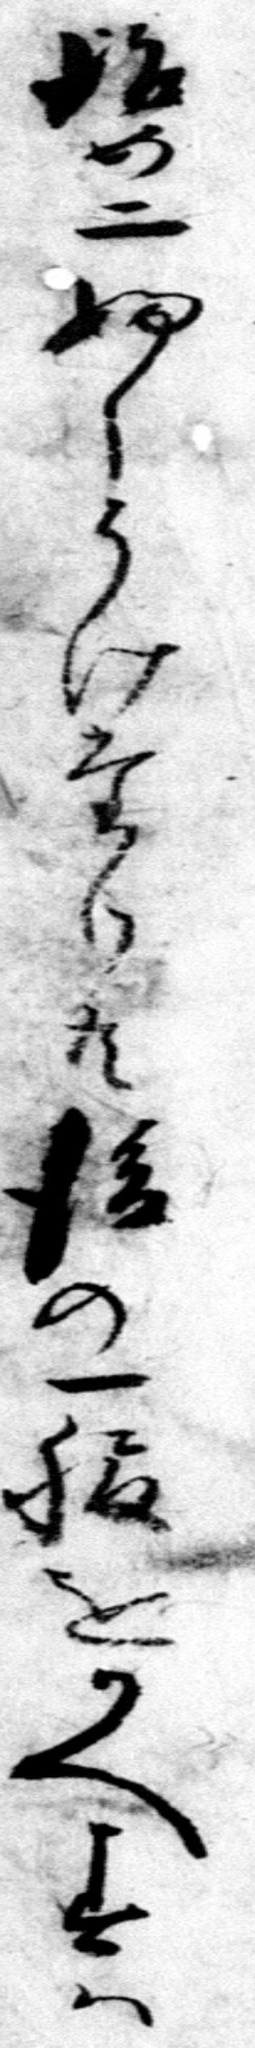始め二ふくうけたり共後の一服をかへすは

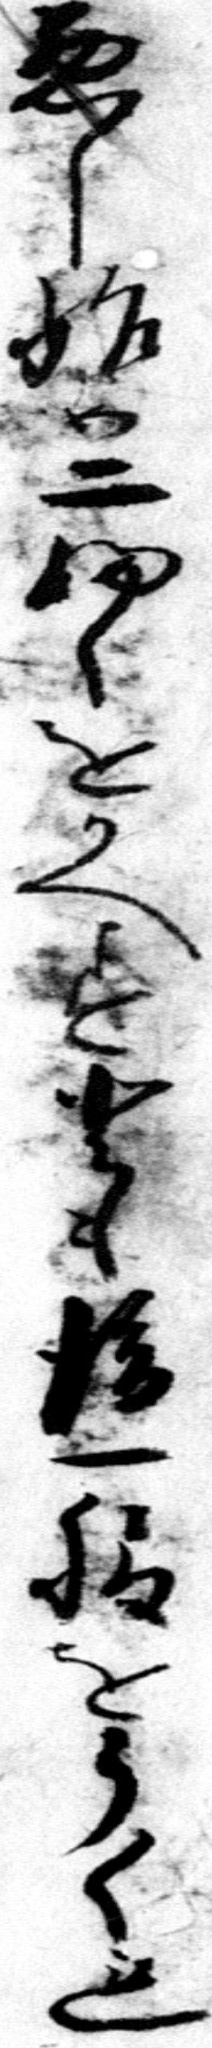悪し始め二ふくをかへすとも後一服をうくれ
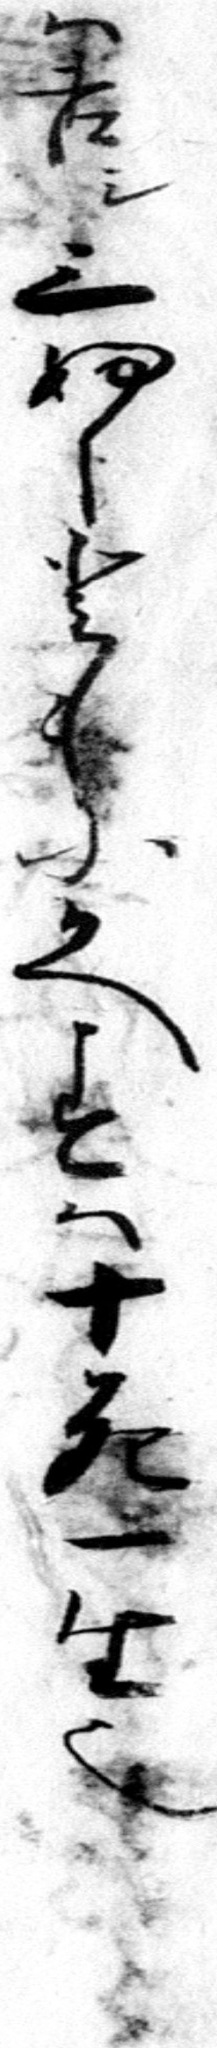は吉し三ふくともにかへすは十死一生也
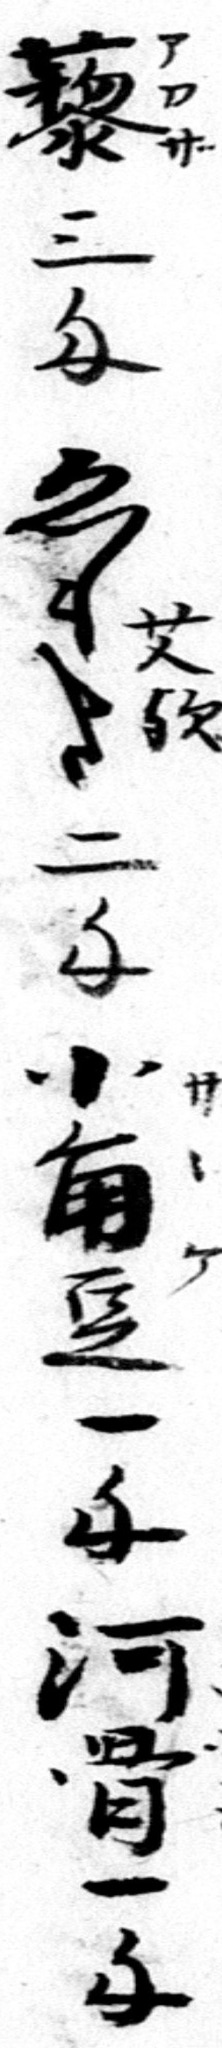藜三匁ゑもき二匁小角豆一匁河骨一匁
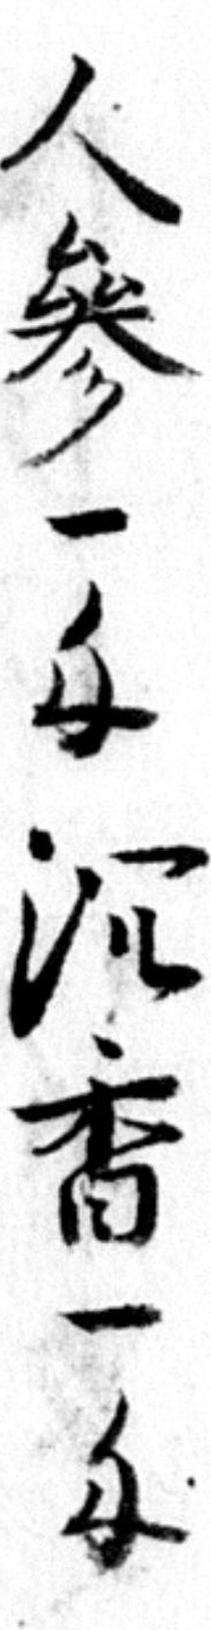人参一匁沈香一匁
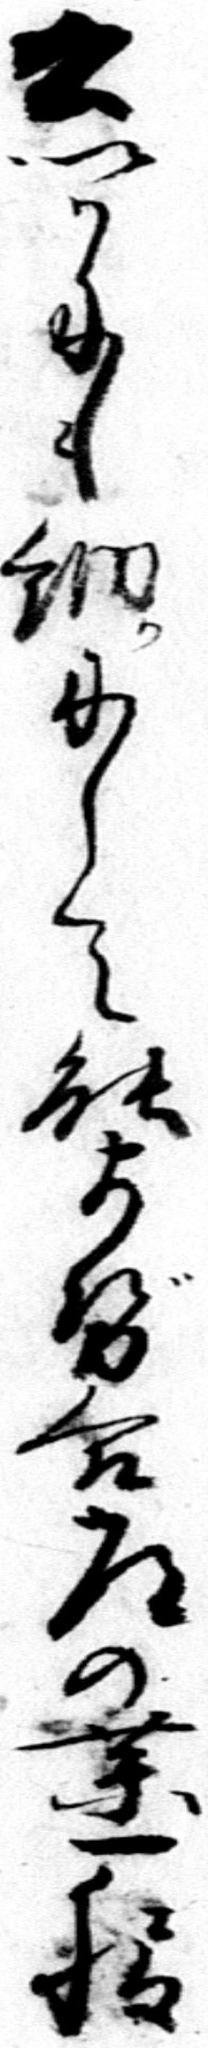右いかにも細かにして能まぜ合常の薬一服
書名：名薬秘伝之書
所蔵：徳島県立図書館
